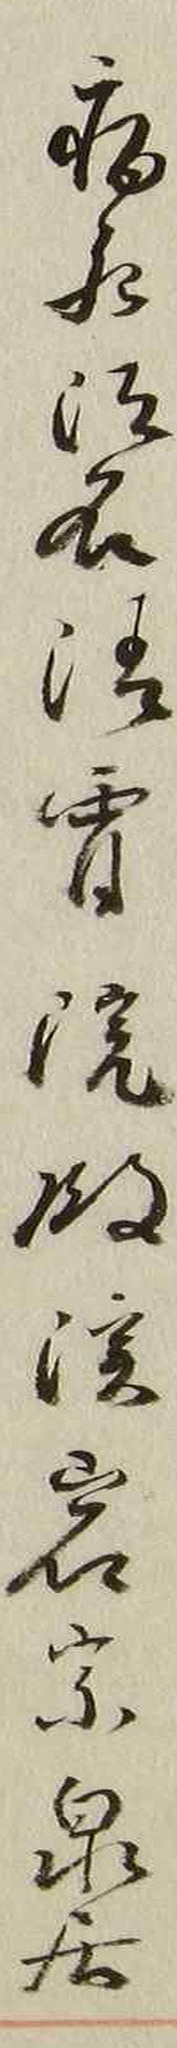病死法名清宵院殿濱岩宗泉居
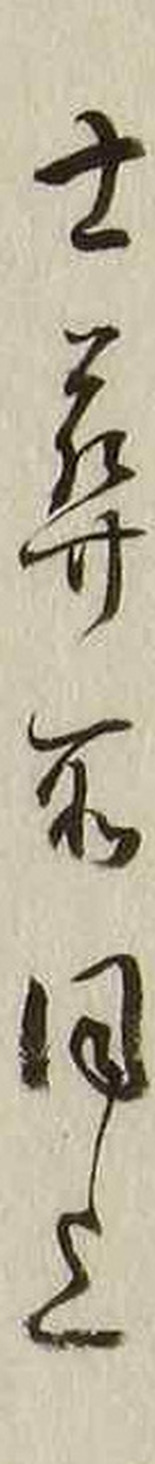士葬所同上
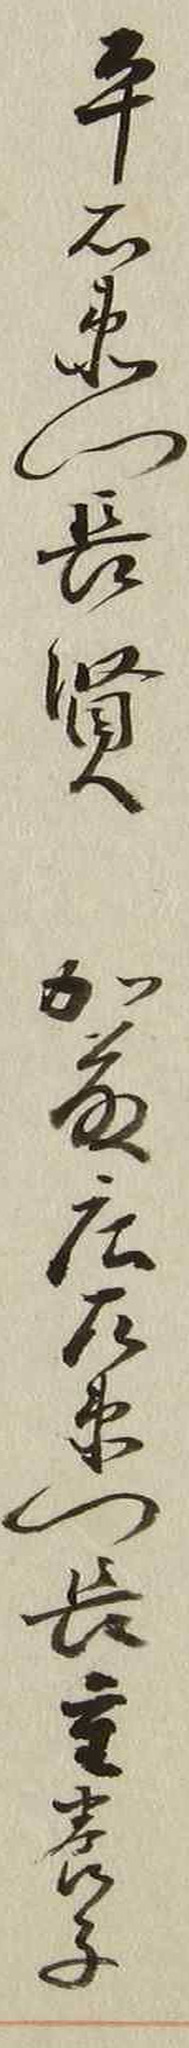平右衛門長賢加藤庄左衛門長重養子
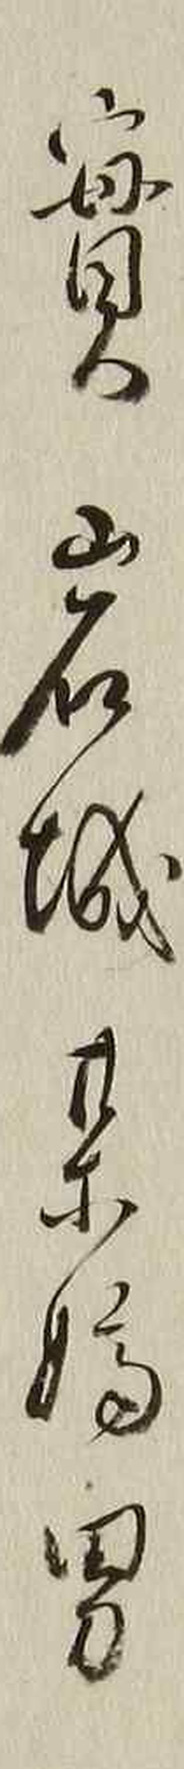実岩城某嫡男
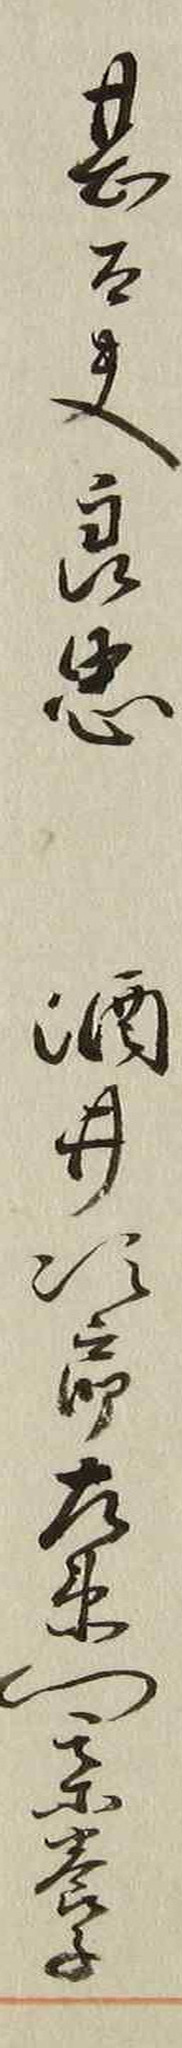甚太夫良忠酒井次郎左衛門某養子
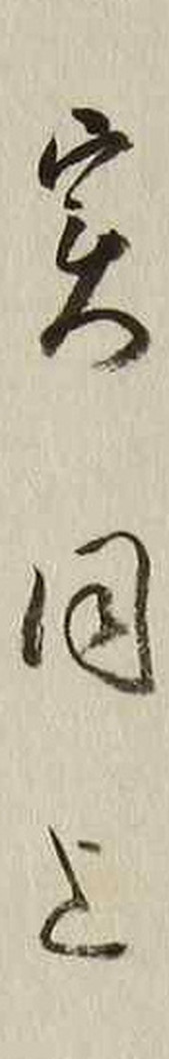実同上
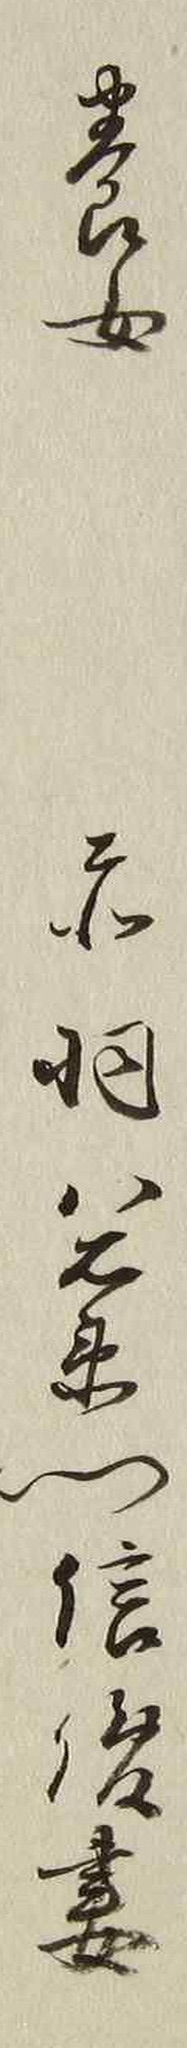養女赤羽八右衛門信俊妻
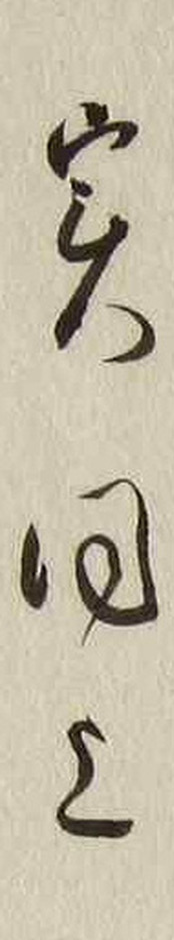実同上
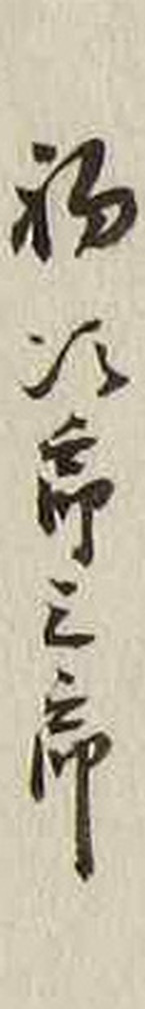初次郎三郎
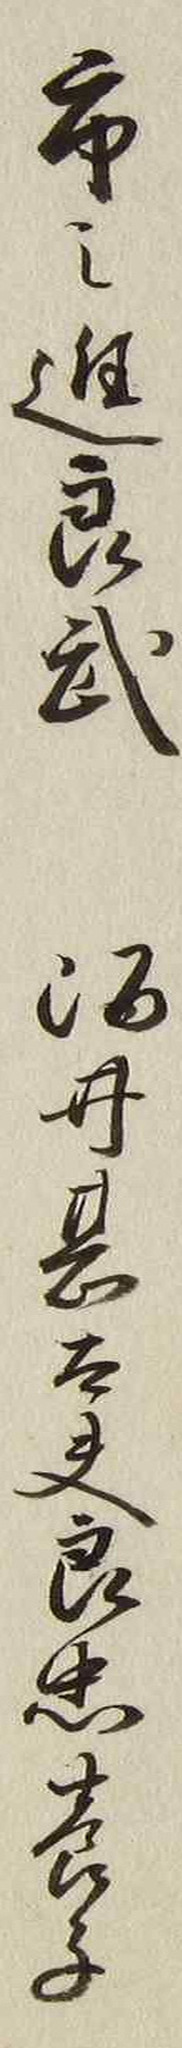市之進良武酒井甚太夫良忠養子
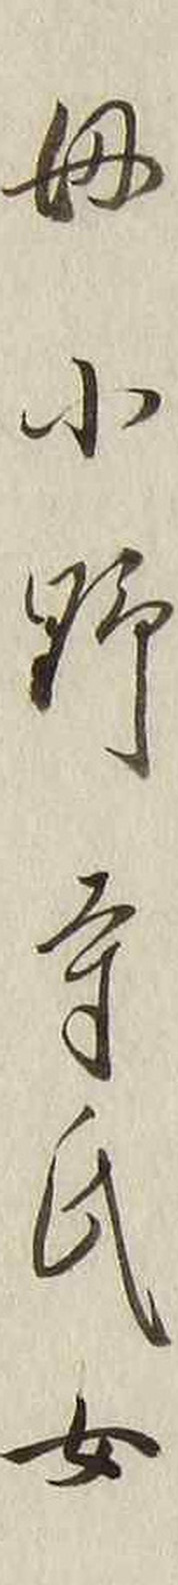母小野寺氏女

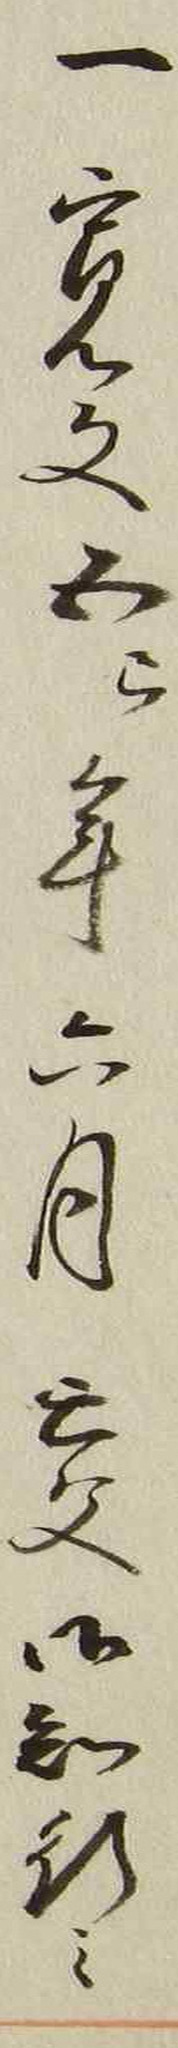一寛文五巳年六月亡父御知行之
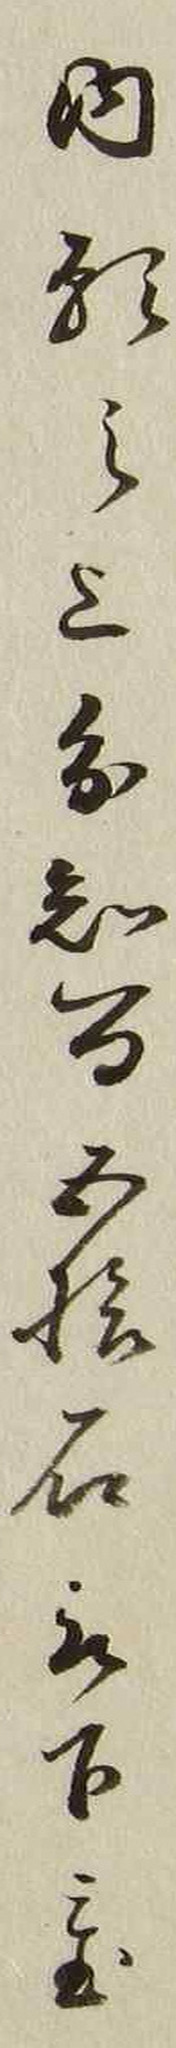内願之上分知百五拾石被下置
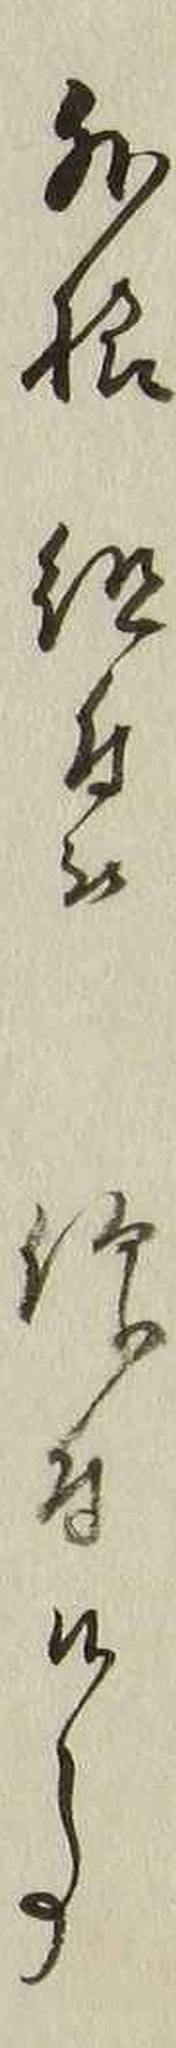外様組付被仰付候事
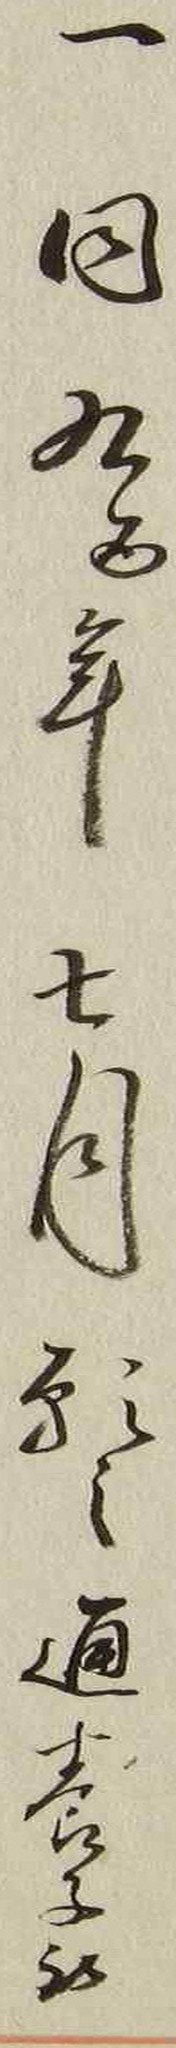一同九酉年七月願之通養子被
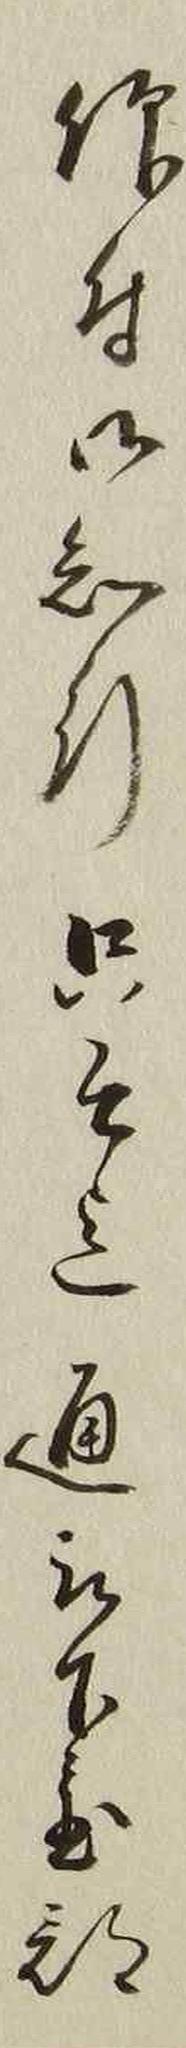仰付御知行只今迄通被下置部
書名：諸士系譜　巻之159　な之部1
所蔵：会津若松市立会津図書館
